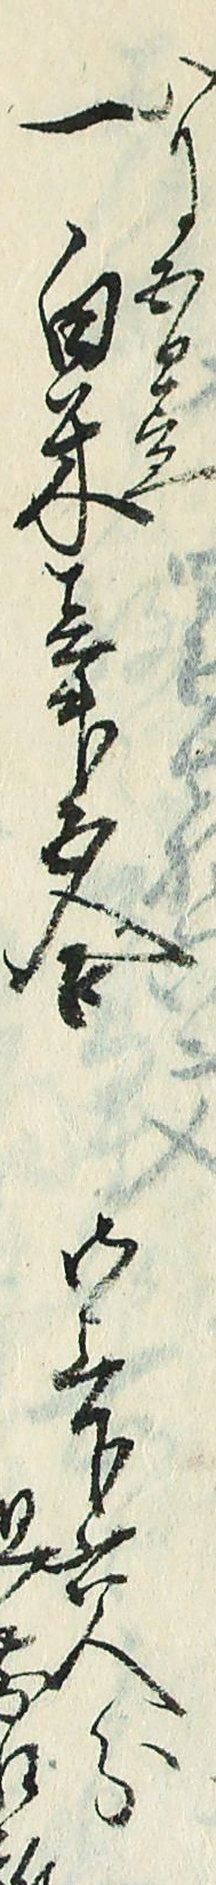一白米壱升五合御上下六人分

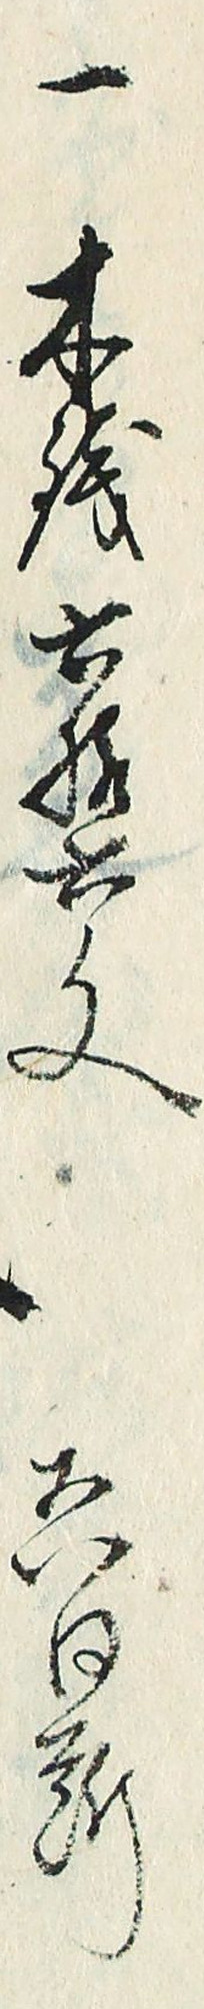一木錢六拾六文右同断
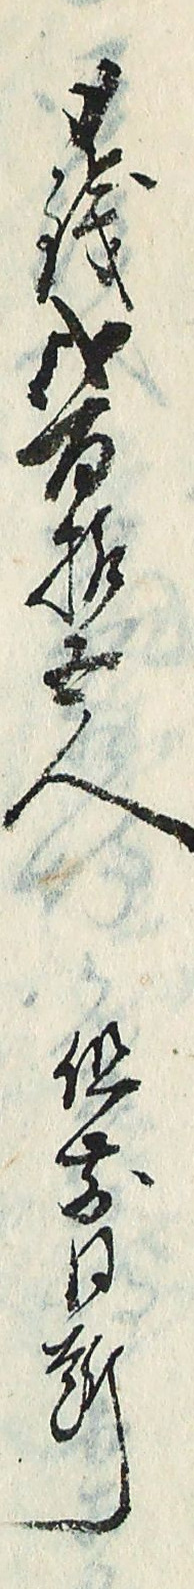〆錢弐百拾五人但前同断
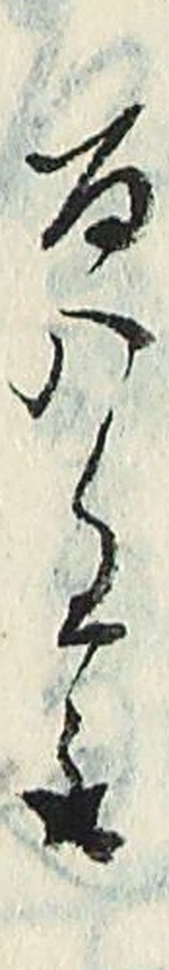百八匁取
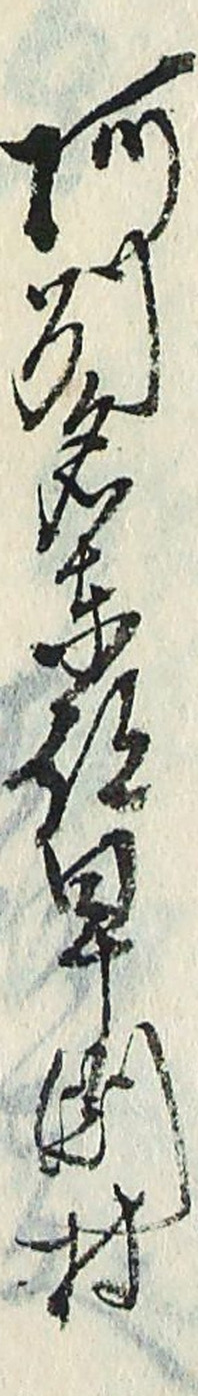阿州名東郡早淵村
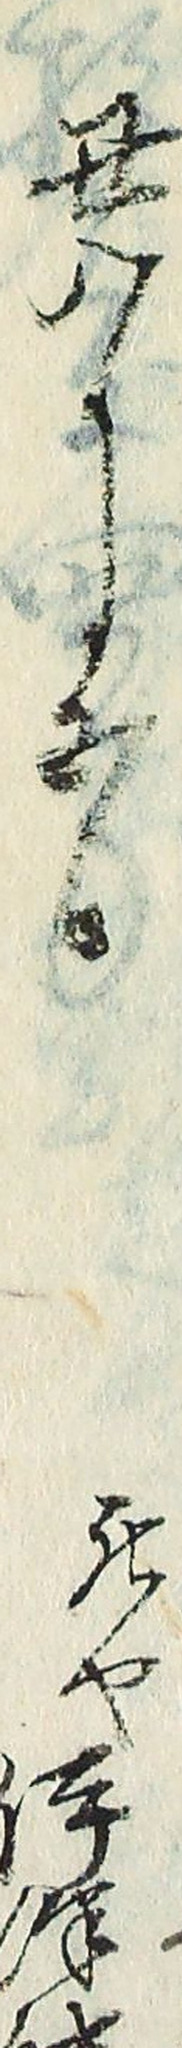丑八月五日庄や伊沢仲助
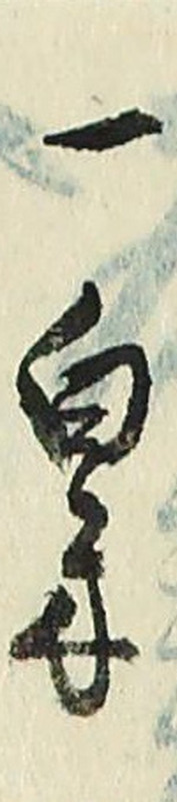一白米
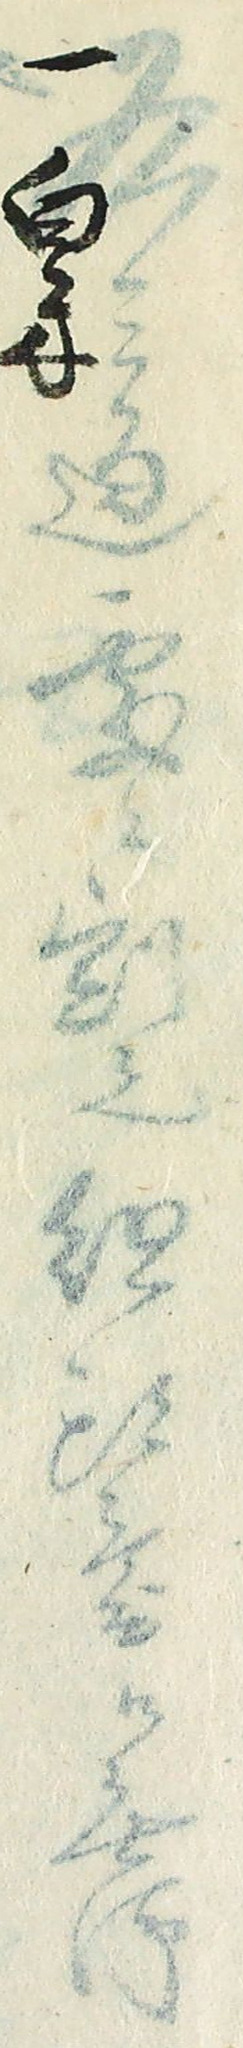一白米
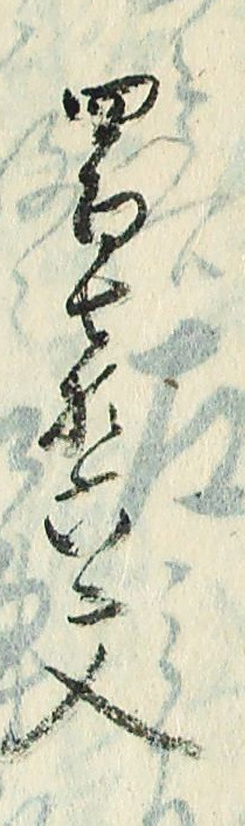〆四百七拾六文

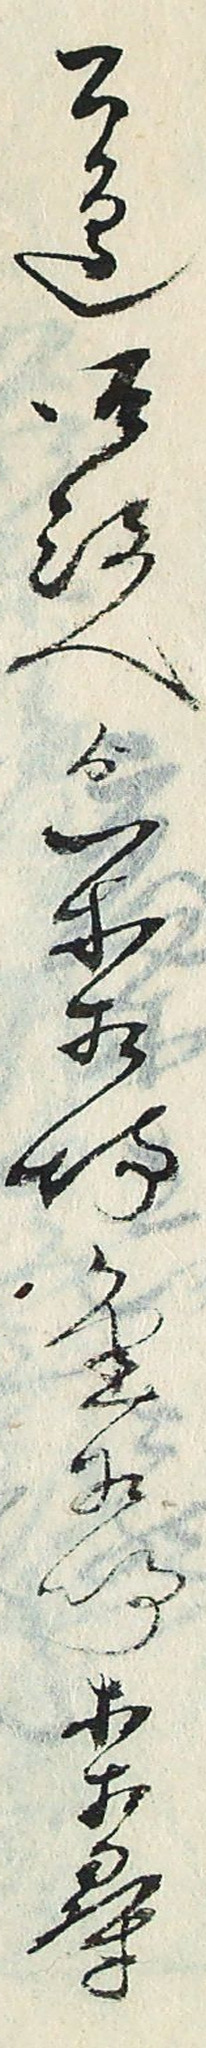公辺御役人ゟ米相場金相場等相尋
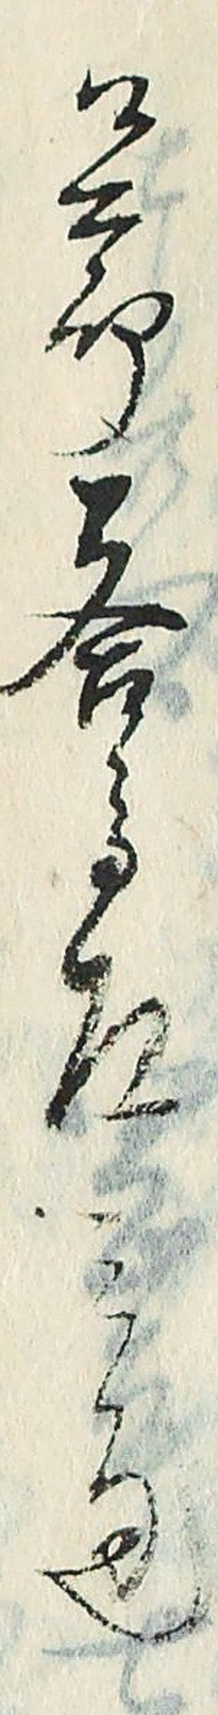候節答候事左之通
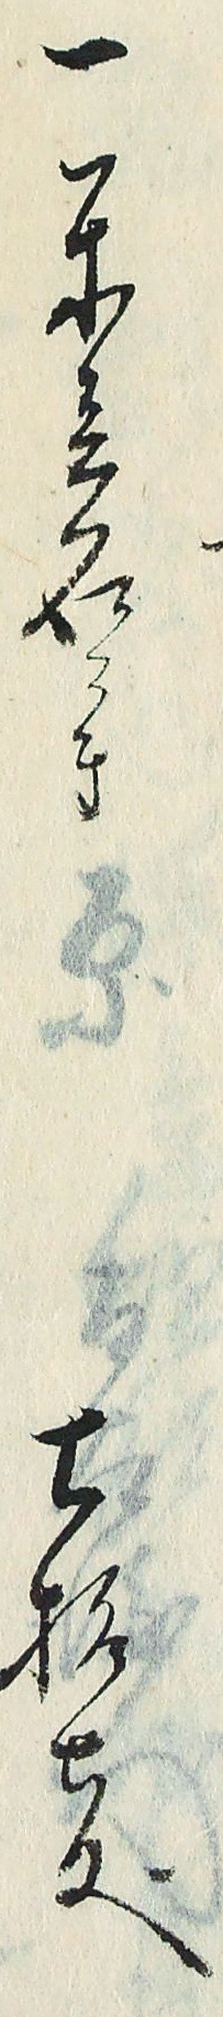一米壱石に付七拾七匁
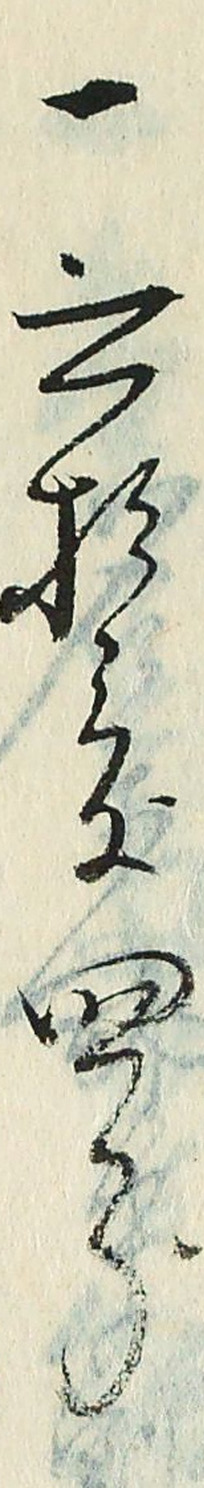一六拾三匁四分
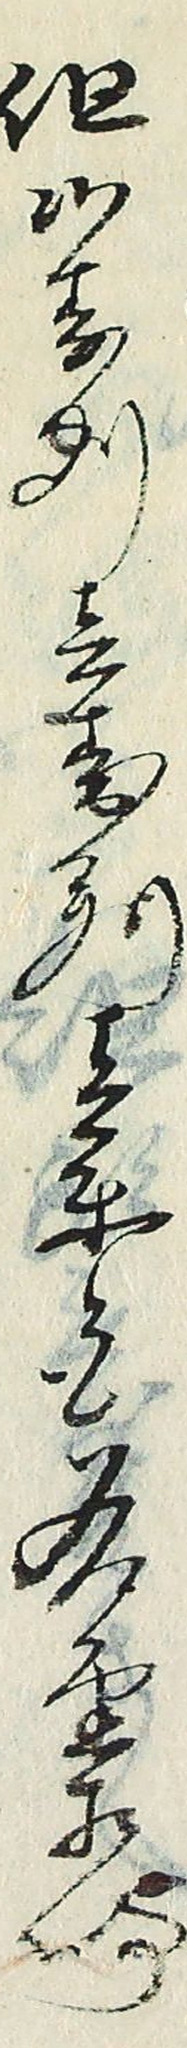但弐歩判壱歩判壱朱とも右金相場
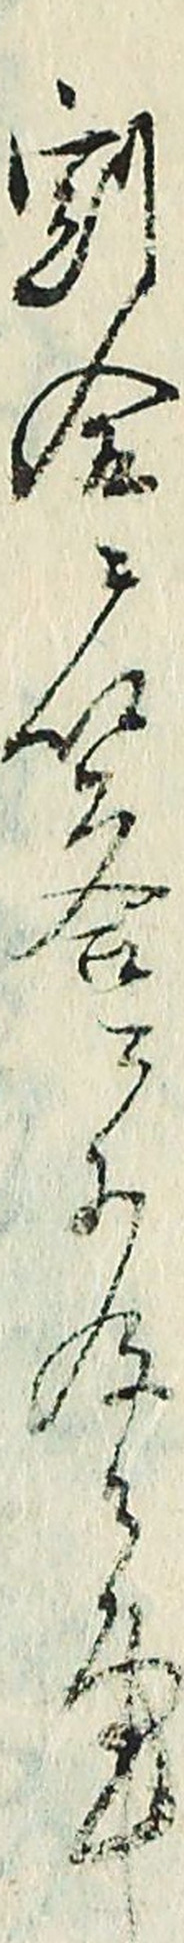割合を以て答に相及候事
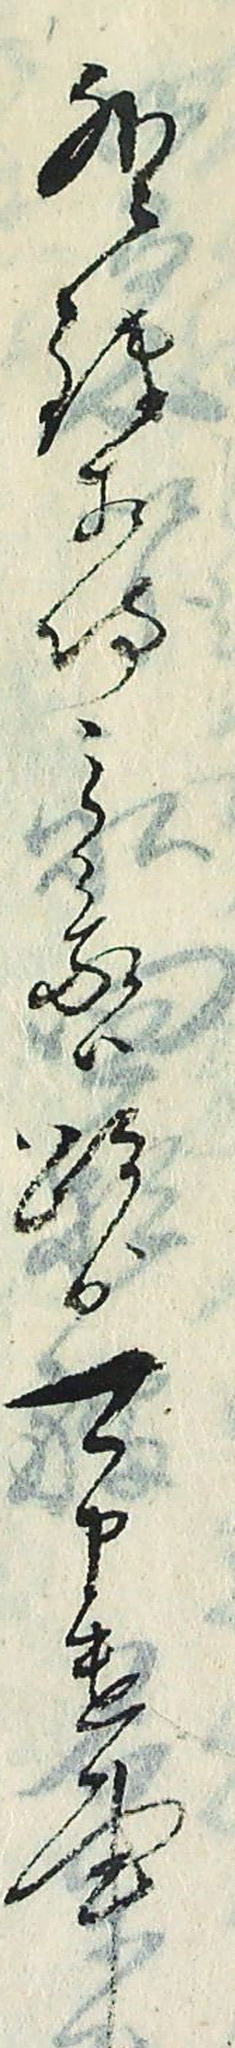外に銭相場之義は跡ゟ可申遣事
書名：公辺御役人為御廻浦御立越諸御用一巻
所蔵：鳴門教育大学 Naruto University of Education
